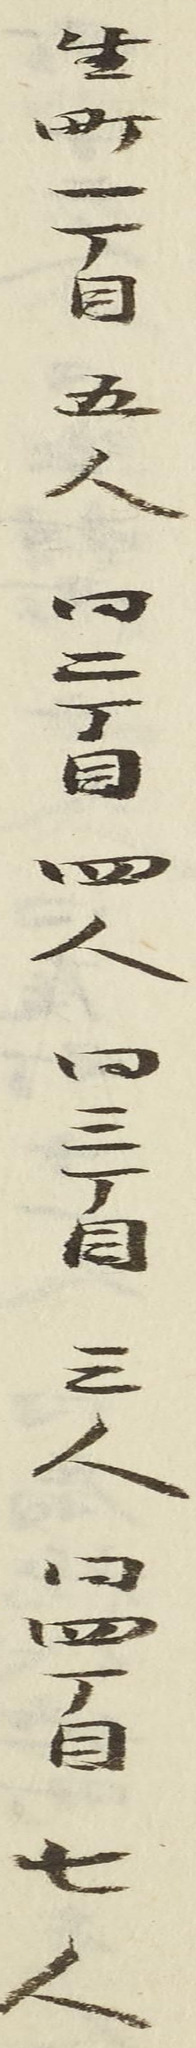生町一丁目五人同二丁目四人同三丁目三人同四丁目七人
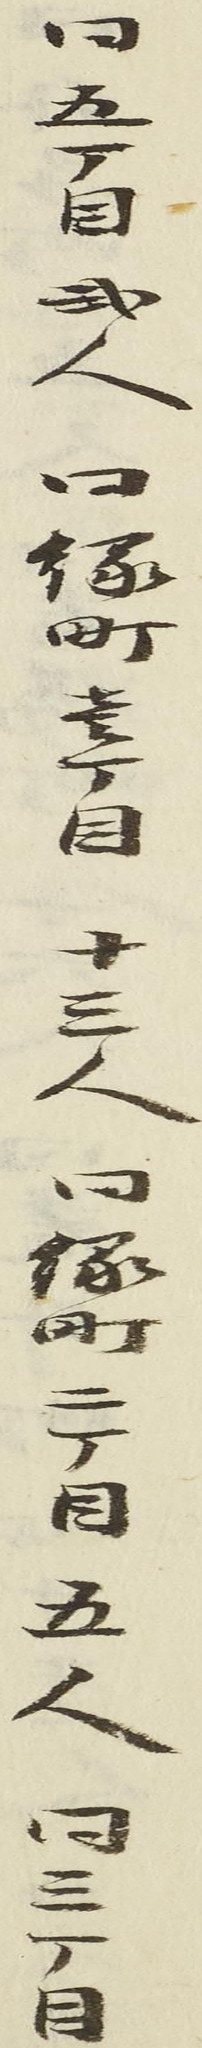同五丁目弐人同緑町壱丁目十三人廿同緑町二丁目五人同三丁目
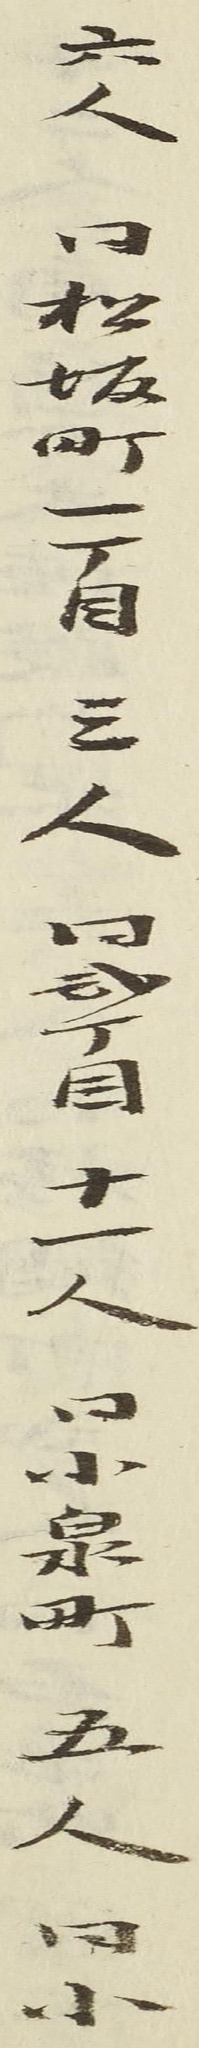六人同松坂町一丁目三人同弐丁目十一人同小泉町五人同小
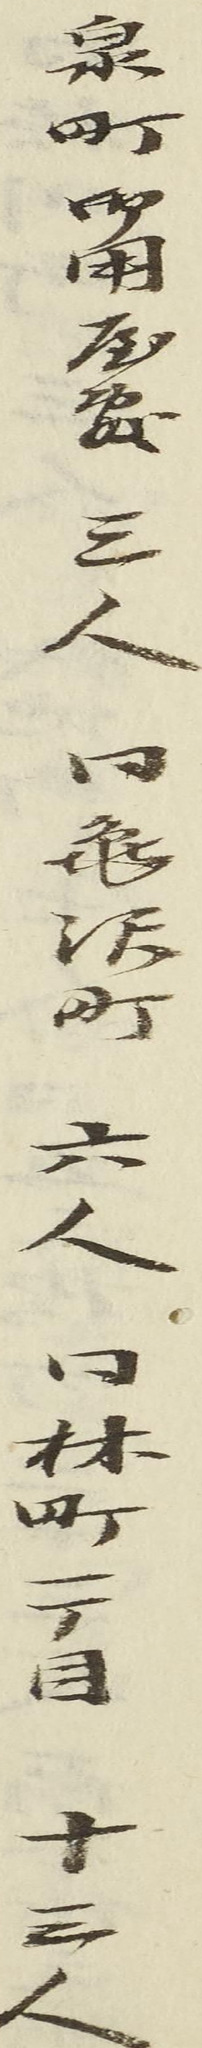泉丁御用屋敷三人同亀沢町六人同林町一丁目十三人廿
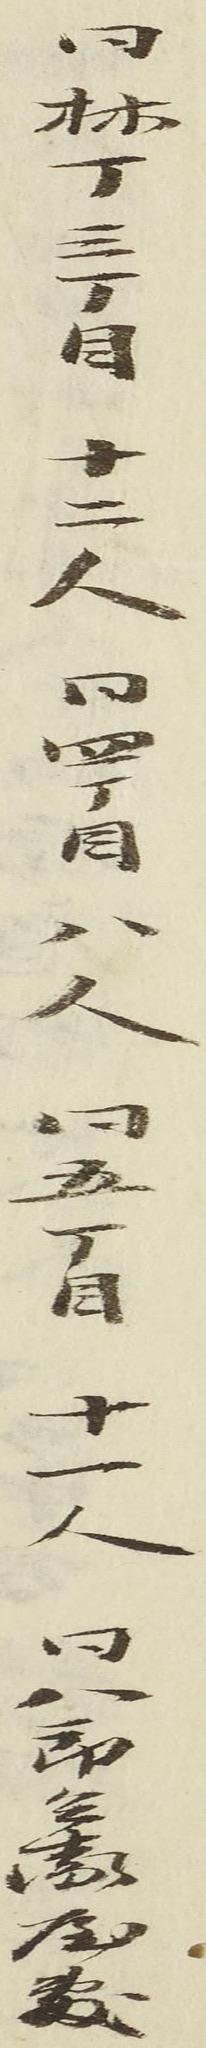同林町三丁目十二人同四丁目八人同五丁目十一人同八郎兵衛屋敷
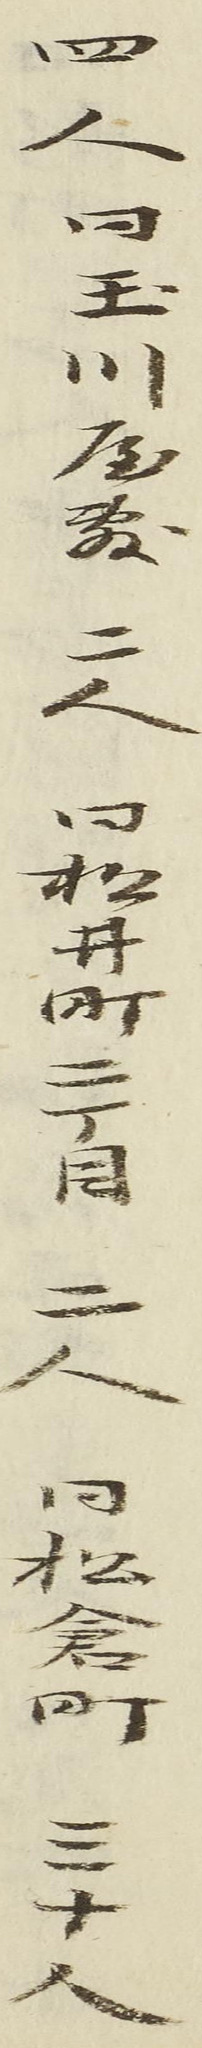四人同玉川屋敷二人同松井町二丁目二人同松倉町三十人

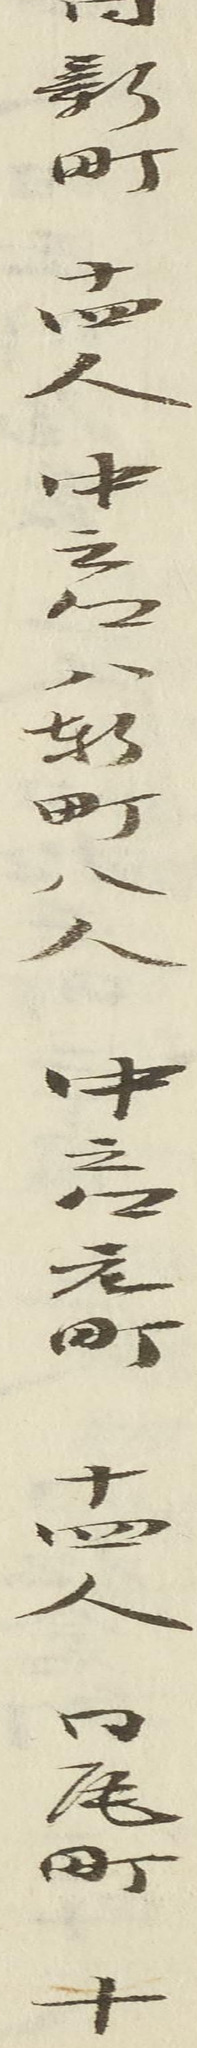同新町十四人中之郷八軒町八人中之郷元町十四人同瓦町十
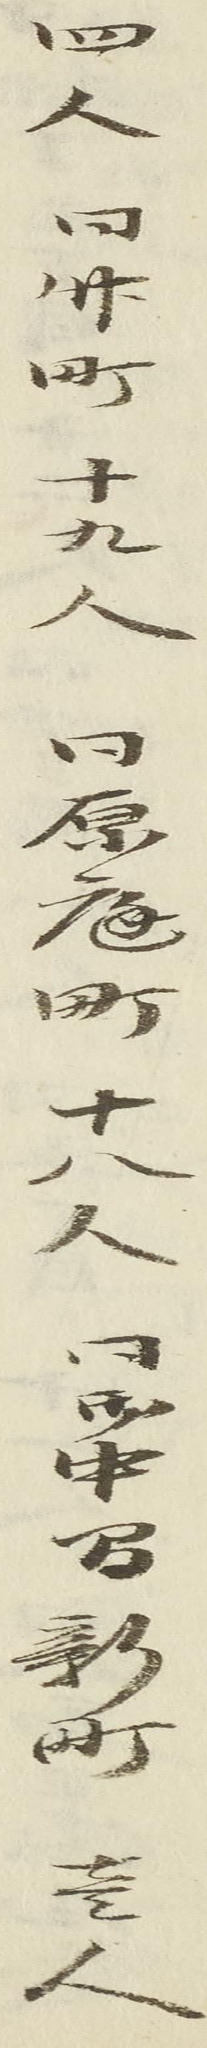四人同竹町十九人同原庭町十八人同御中間新町壱人
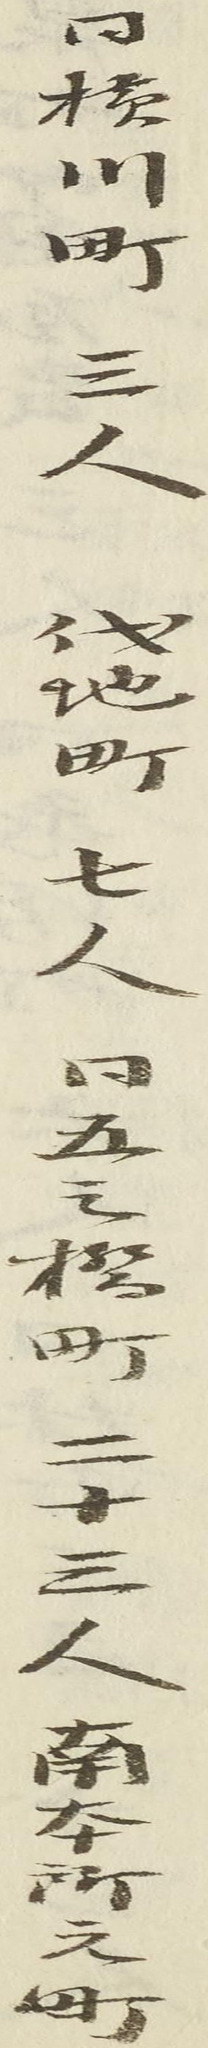同横川町三人代地町七人同五之橋町二十三人南本所元町
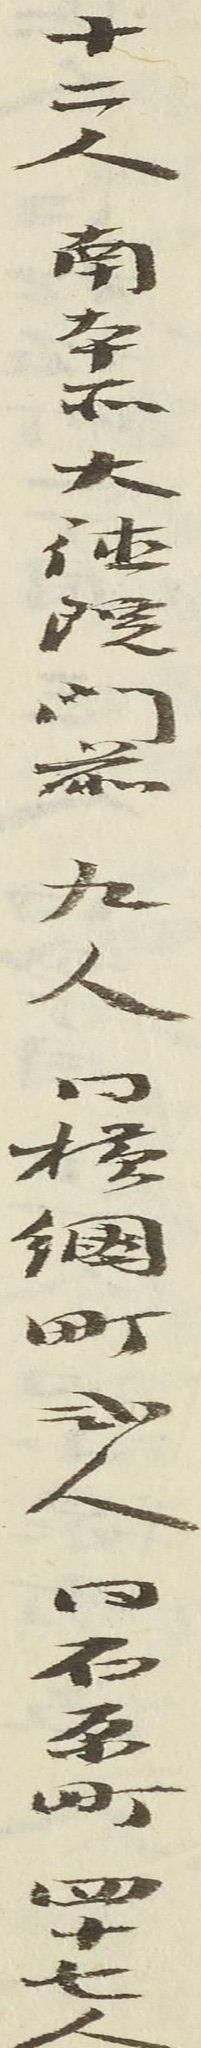十二人南本所大徳院門前九人同横網町弐人同石原町四十七人
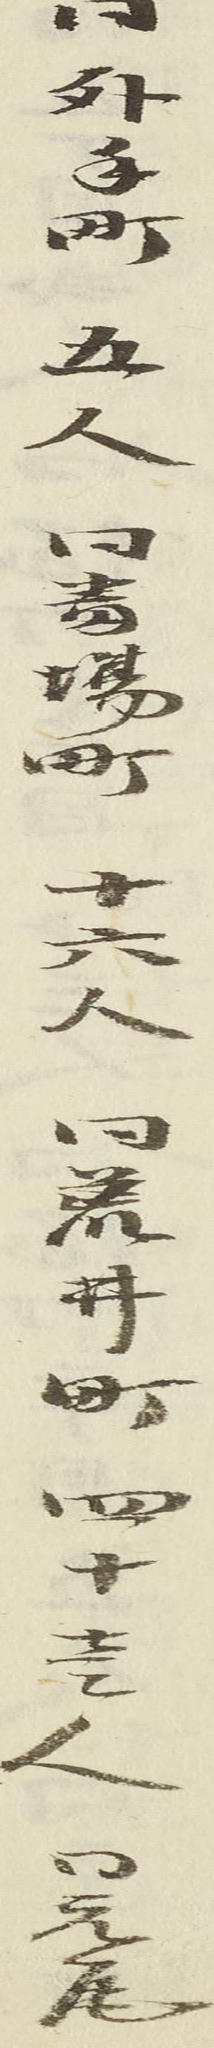同外手町五人同番場町十六人同荒井町四十壱人同元瓦
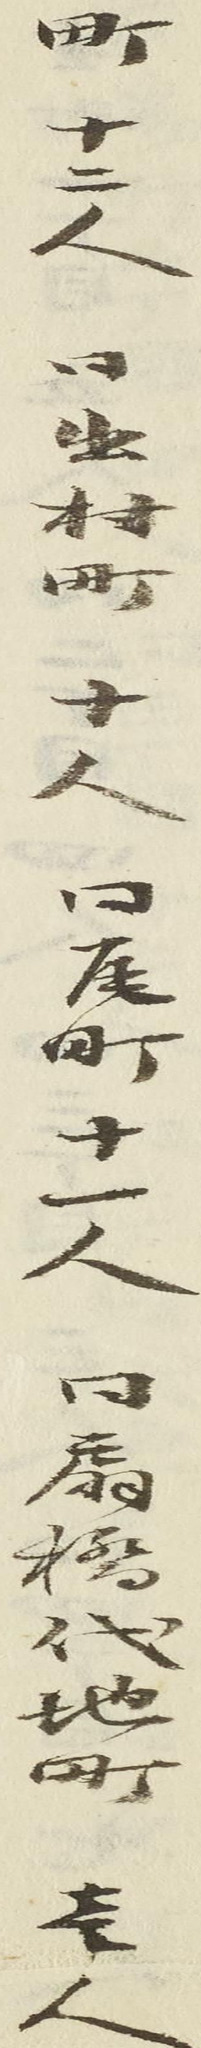町十二人同出村町十人同瓦町十一人同扇橋代地町壱人
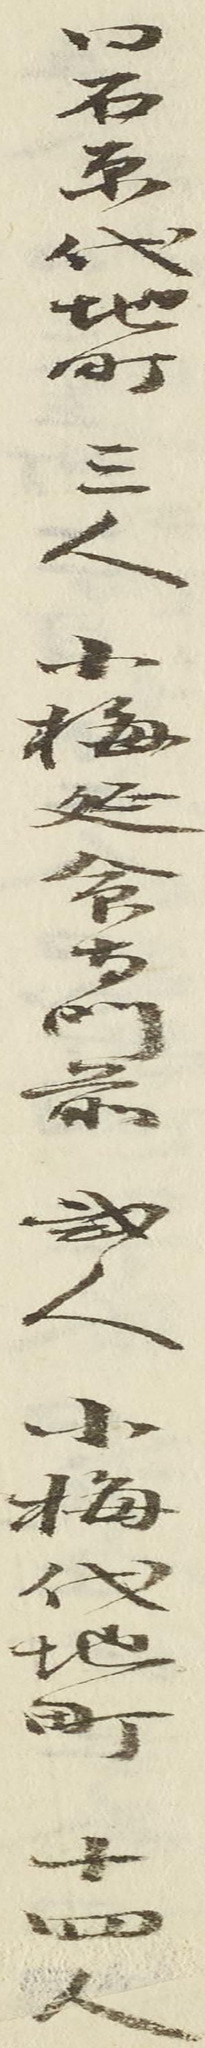同石原代地町三人小梅延命寺門前弐人小梅代地町十四人
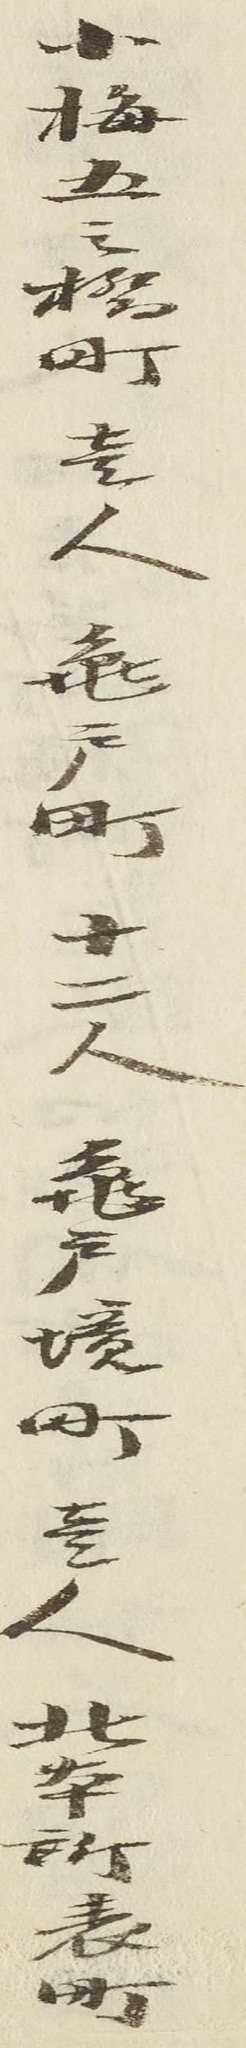小梅五之橋町壱人亀戸町十二人亀戸境町壱人北本所表町
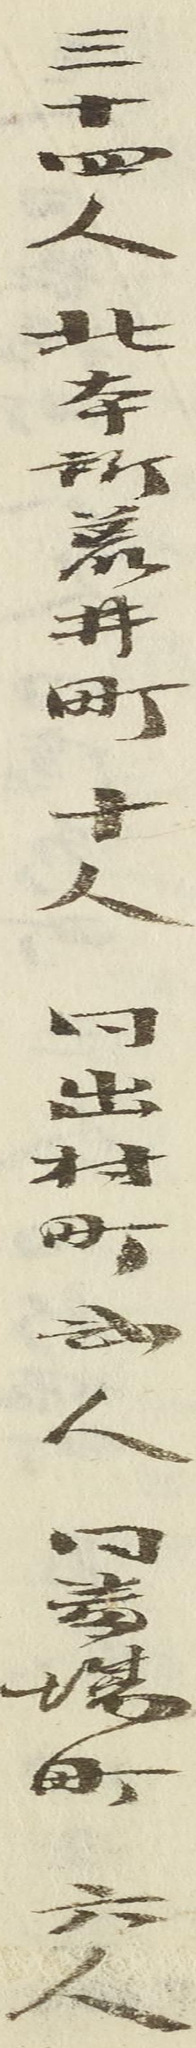三十四人北本所荒井町十人同出村町弐人同番場町六人
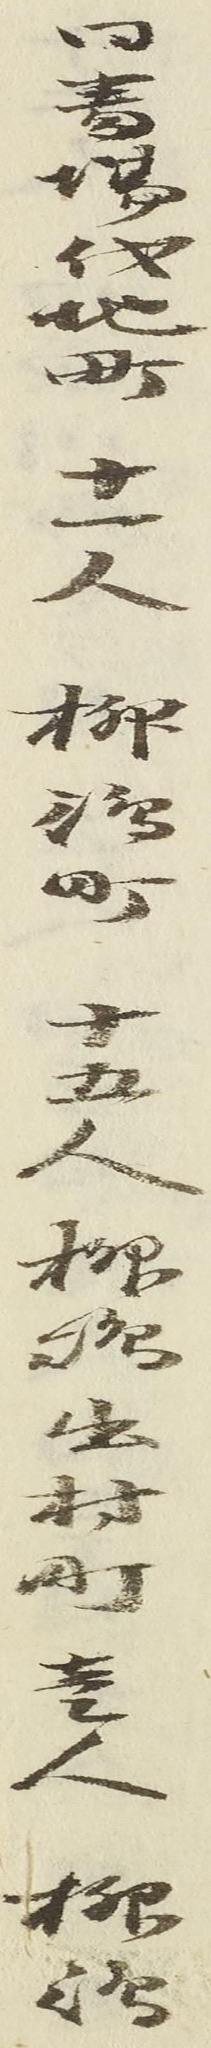同番場代地町十一人柳嶋町十五人柳嶋出村町壱人柳嶋
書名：那為の後見艸　全
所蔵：東京大学地震研究所図書室 Earthquake Research Institute Library, The University of Tokyo, JAPAN
